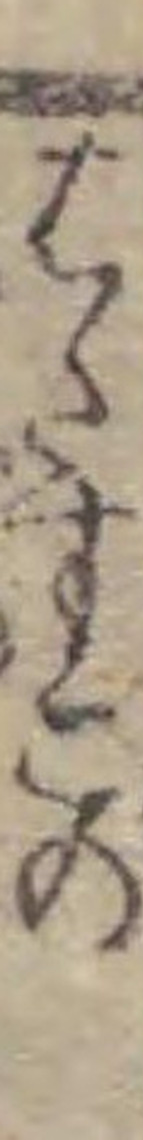はたすこの
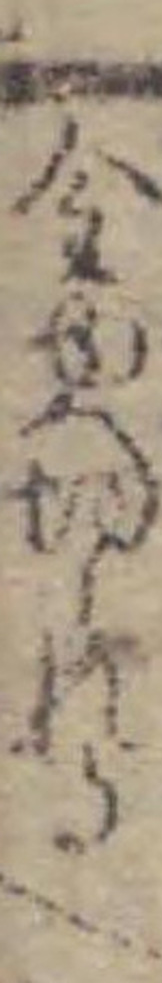金ゆへ切られる
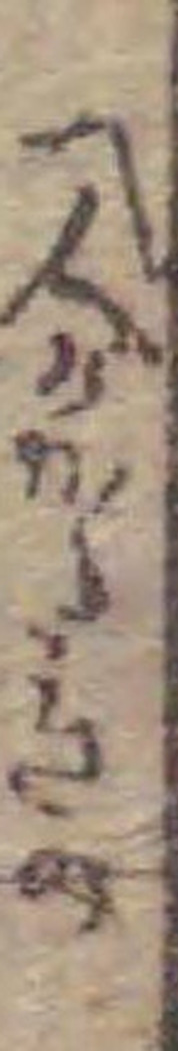〽人かかたきの
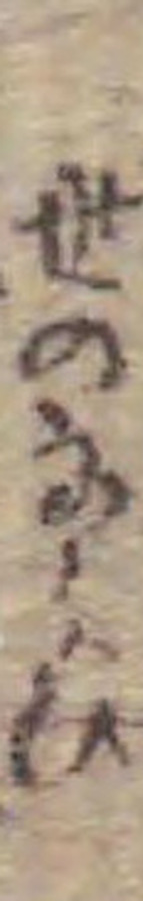世のならひ
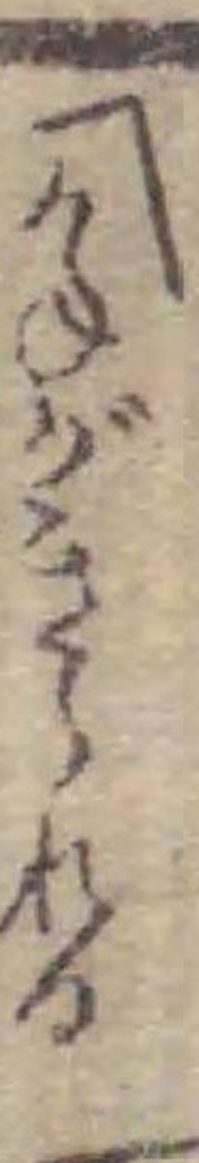〽かねがきられる
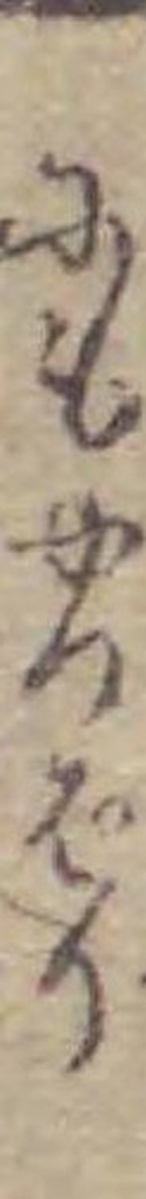にもやつぱり
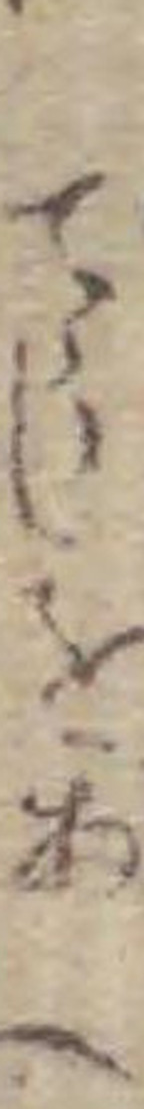てうしをあ
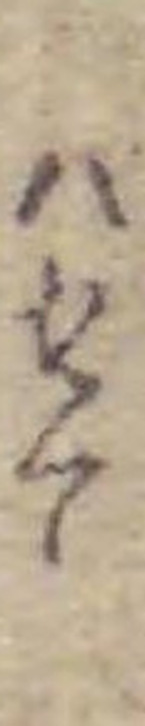はせて
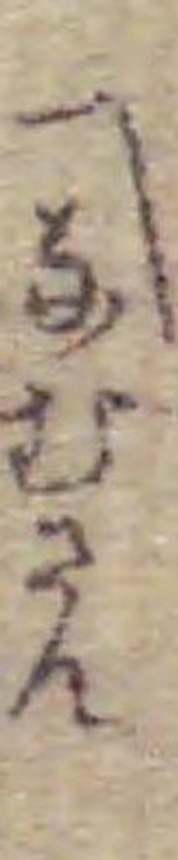〽なむさん
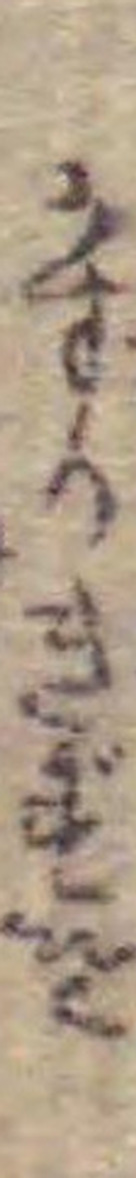かすりきずを
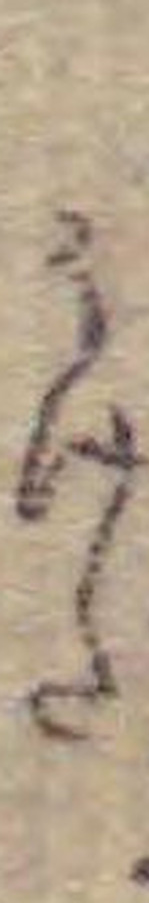うけた
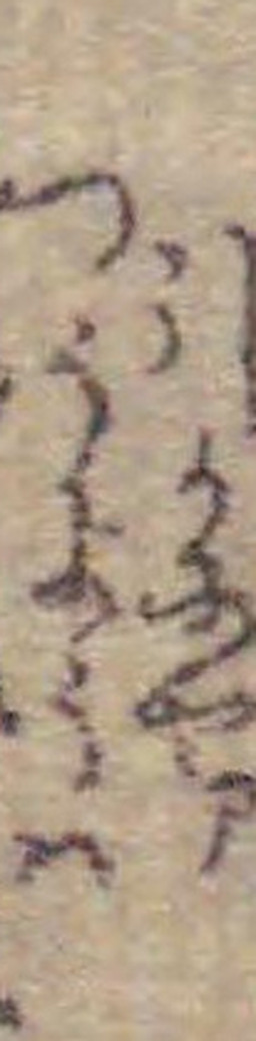つうようは
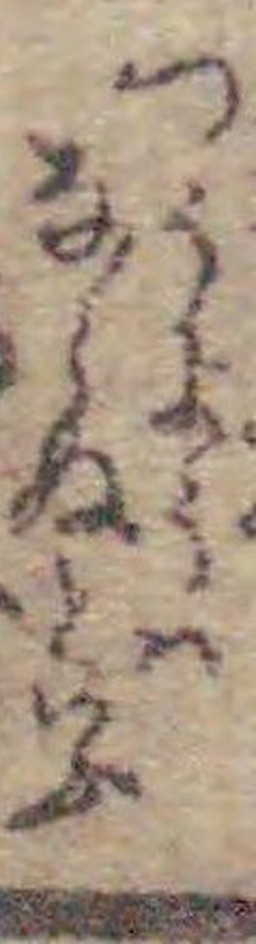ならぬといふ

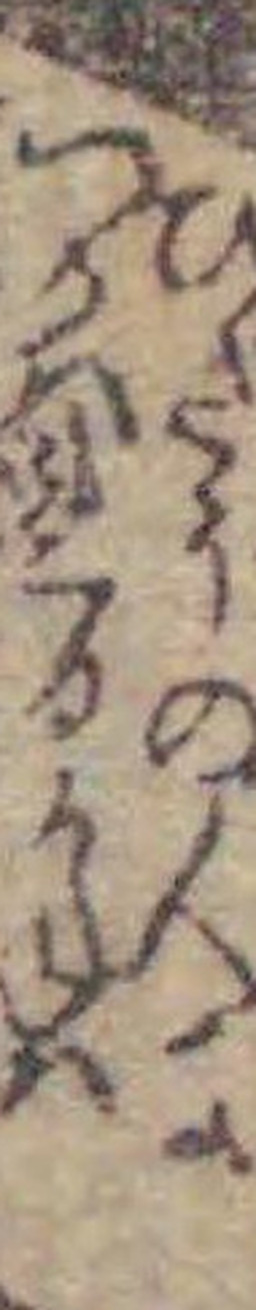つかはれるかねは
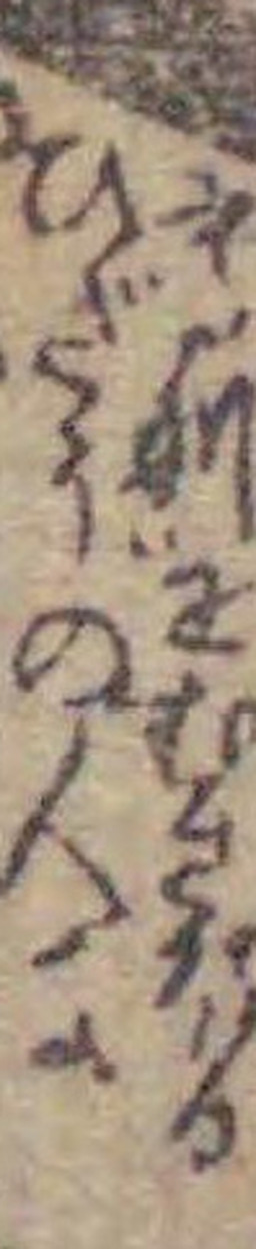ひだうの人に
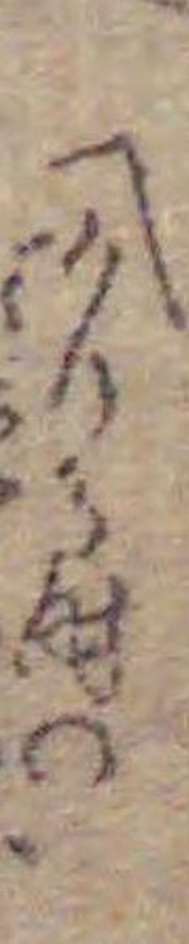〽かりる時の
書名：新鋳小判 : 3巻
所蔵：国立国会図書館 National Diet Library, JAPAN
